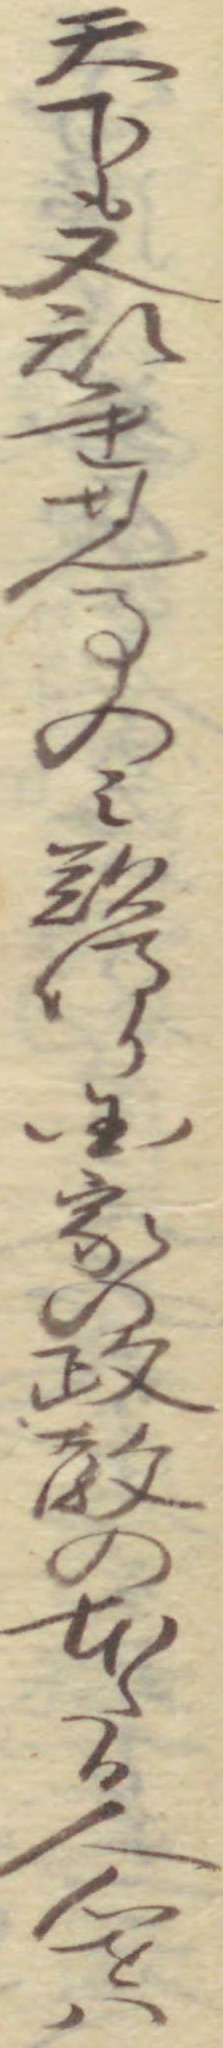天下も又乱れなん事のみ歎侍り国家の政教の本たる人心をは
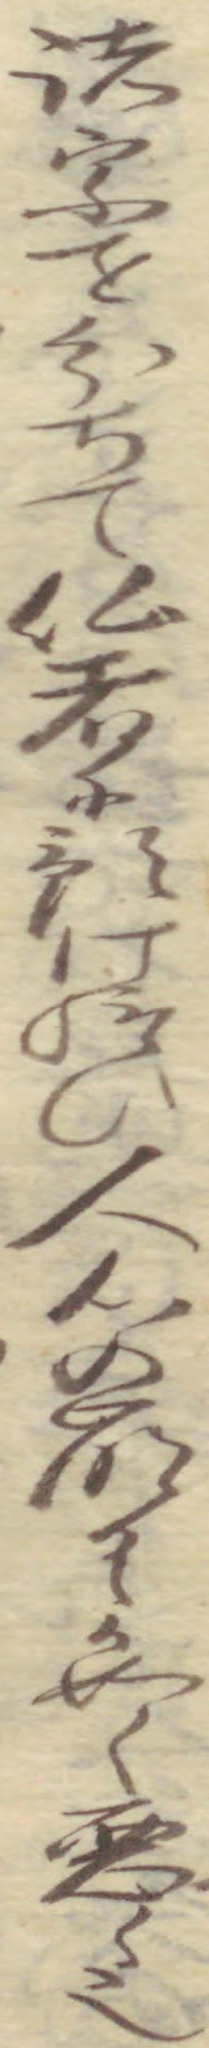諸宗を分ちて仏者に預け給ひ人心の崩るゝか如く悪く也
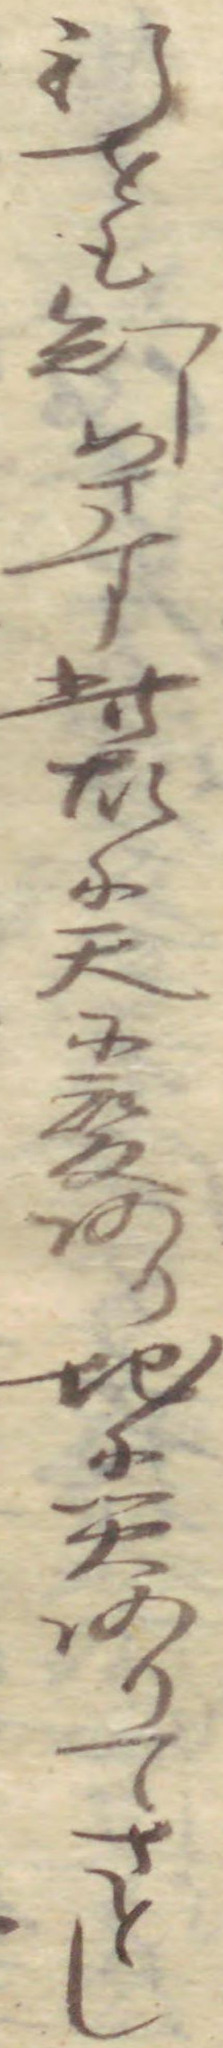行をも知しめさす此故に天に変あり地に災ありてさとし
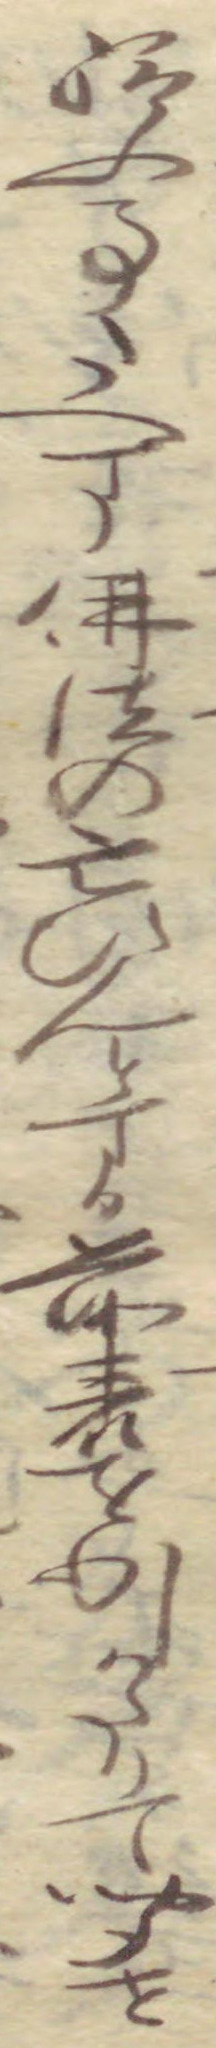給ふ事たへす仏法の亡ひんとする前表を少しかたりて聞せ
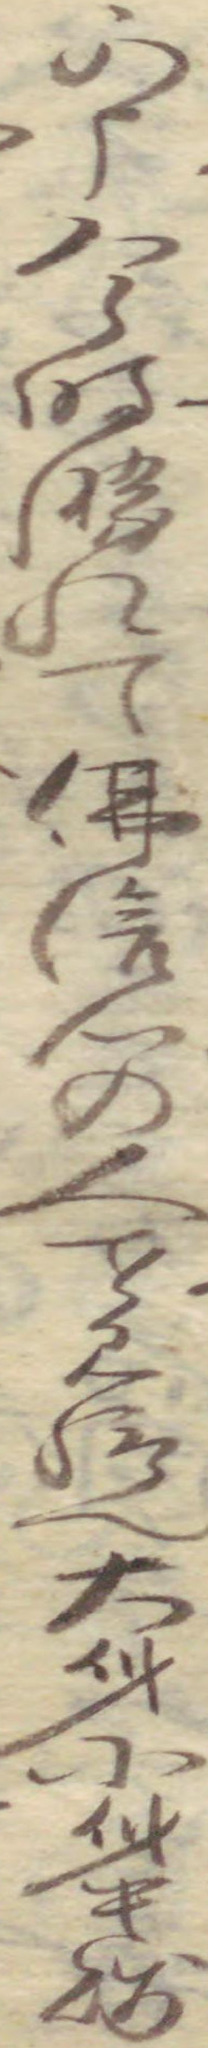可申今時勝れて仏信心の人を見給へ大身小身貴賎
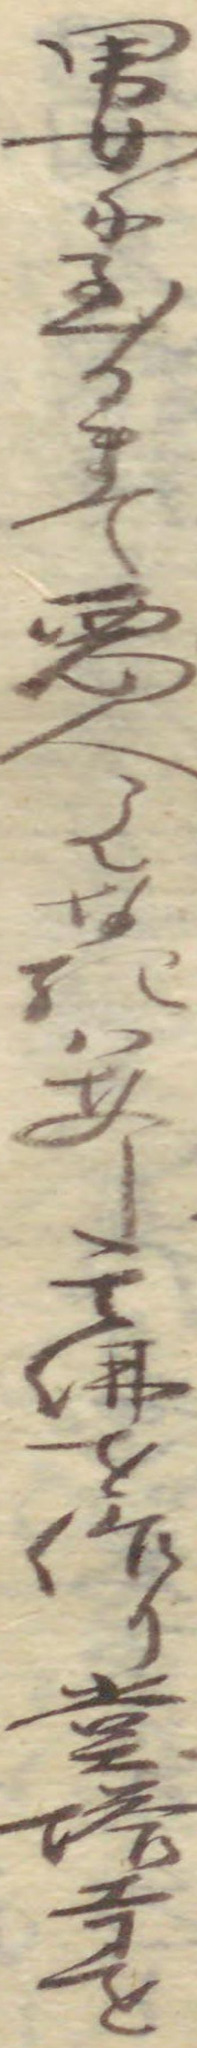男女に至るまて悪人ニてなきはなし其仏を作り堂塔寺を
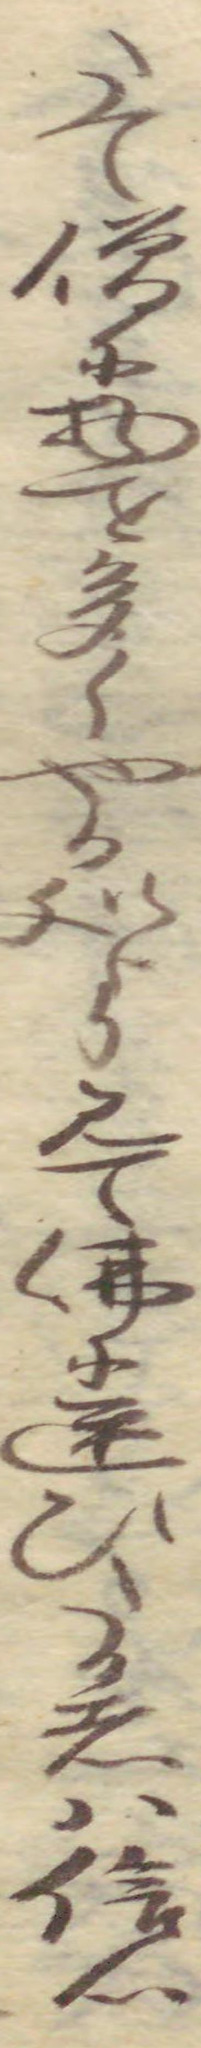たて僧に物を多くやる処より見て仏に迷ひたる者は信心
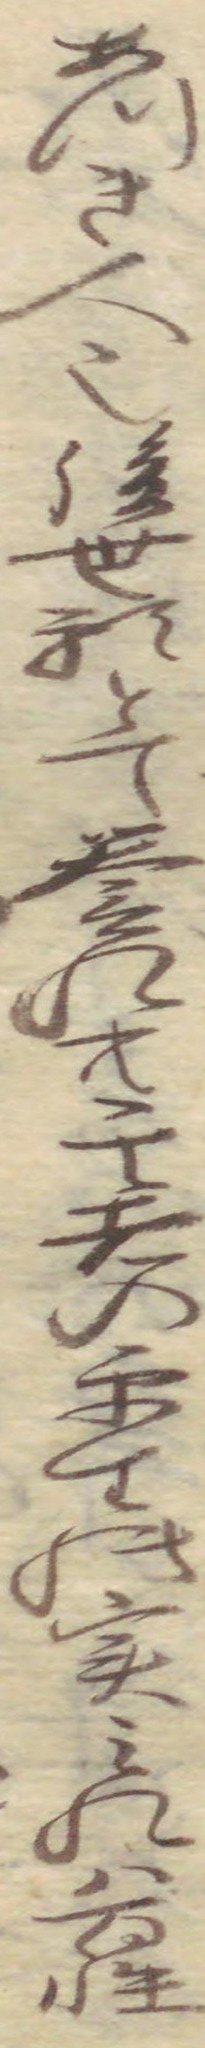あつき人也後世願とて誉れ共其者の平生の実みれは百姓
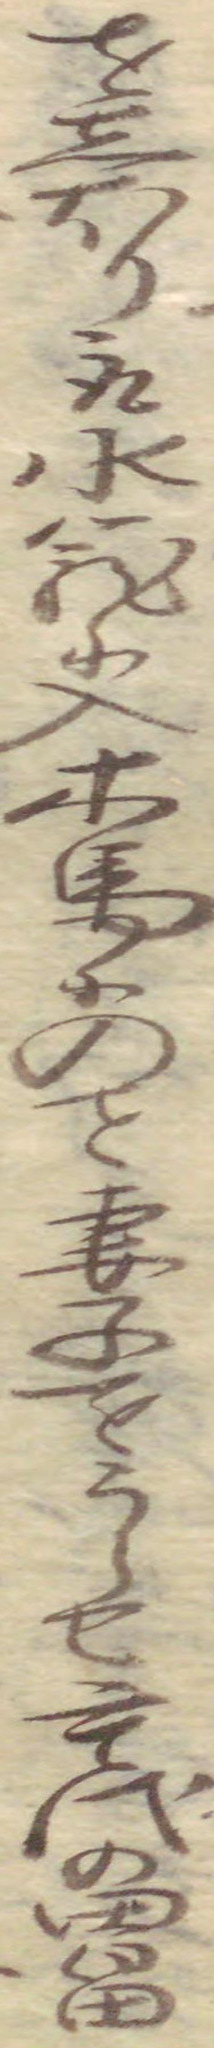をしほり取水籠に入木馬にのせ妻子をうらせ重代の田畠
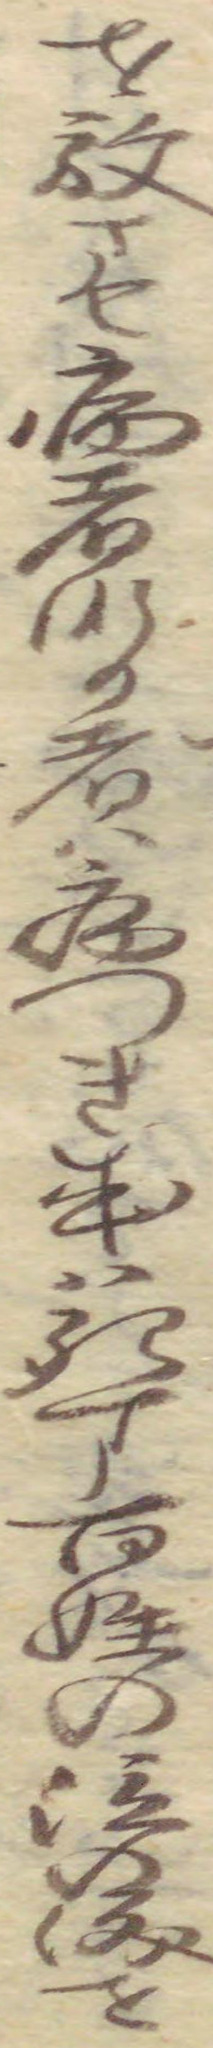を放させ病者なる者は病つき或は死す百姓の泣の涙を
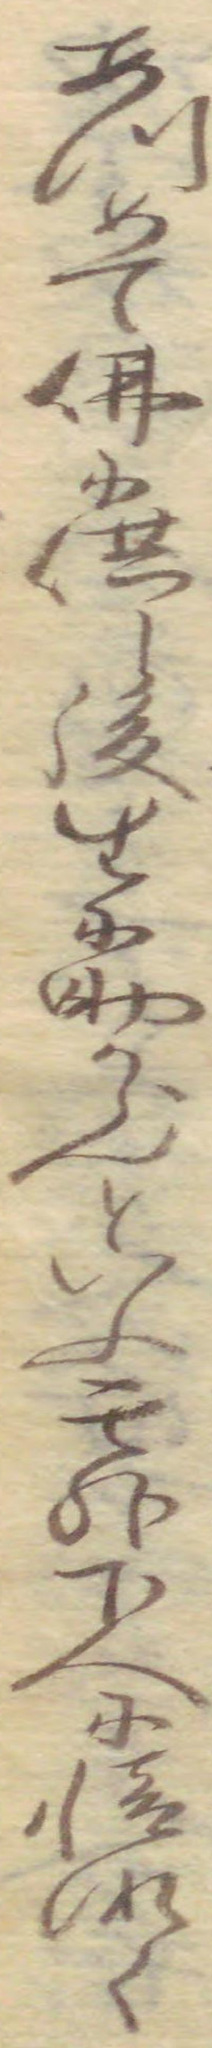あつめて仏に供し後生に助からんといふ其外下人に情なく

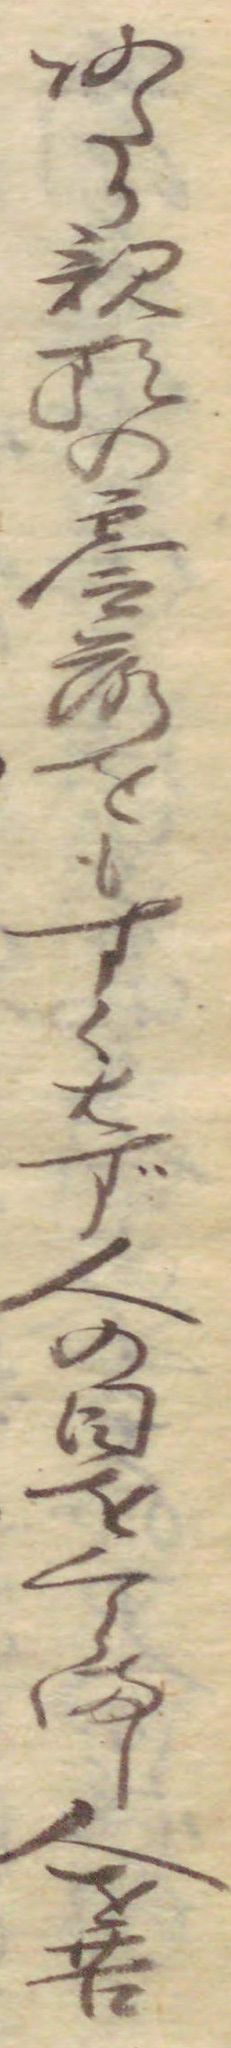あたり親類の零落をもすくはず人の目をくらまし人を苦
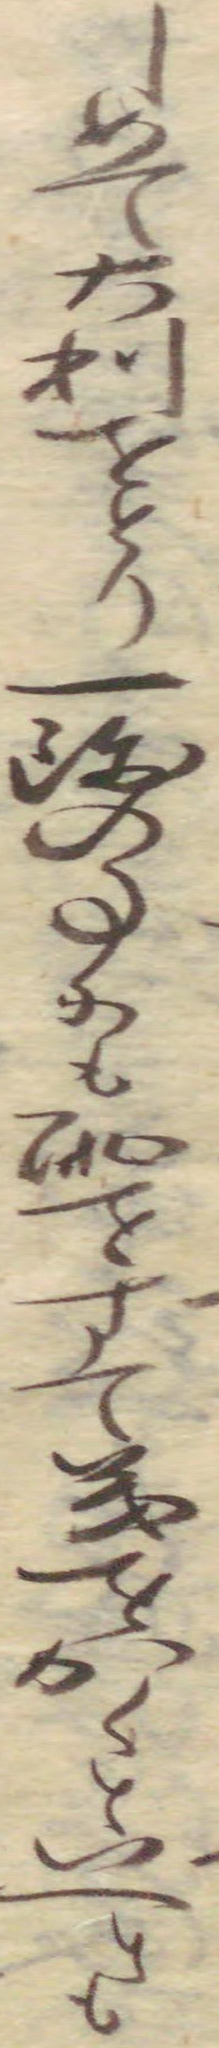しめて大利をとり一銭の事にも恥をすて義をかくといへとも
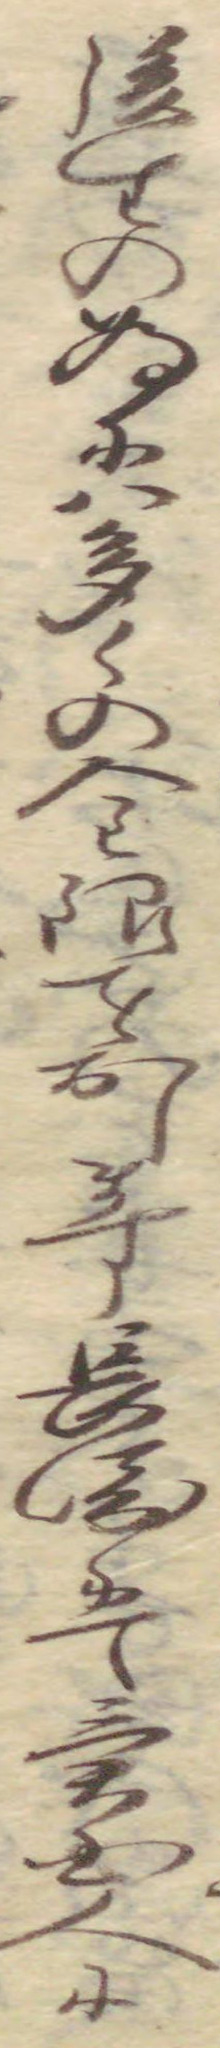後生の為には多くの金銀をおします長崎にて異国人に
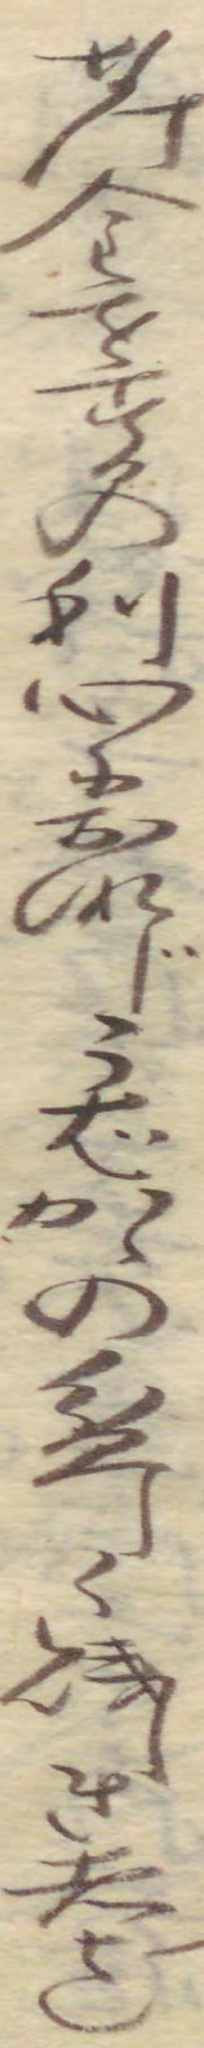なけ金をするの利心におなじうばかゝの貧しく賎しき者迄
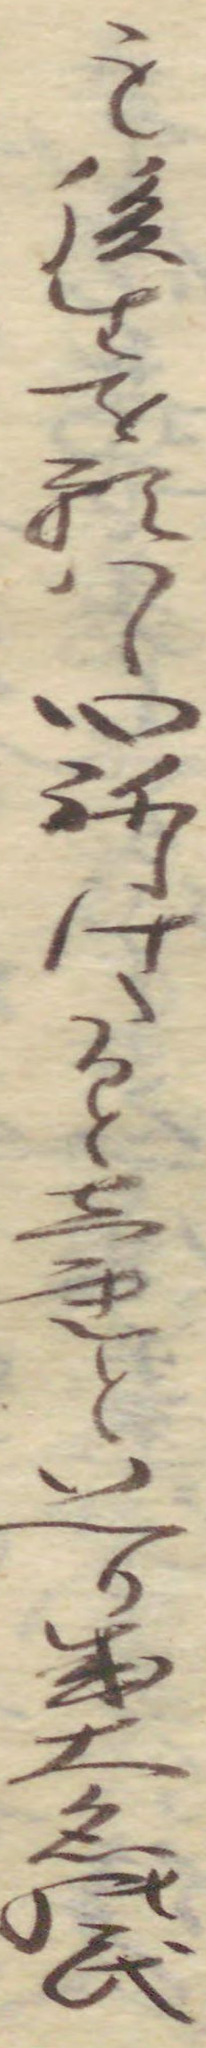も後生を願はゝ心ねしけたるとしれといへり或大名の民
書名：鶯宿雑記. 巻263-264
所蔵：国立国会図書館 National Diet Library, JAPAN
